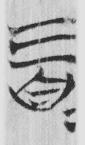{三百}=
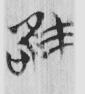唯
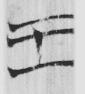王
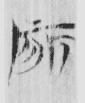所
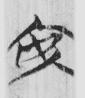安
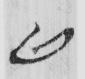㠯（以）
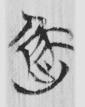屈
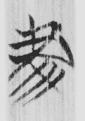𦘔
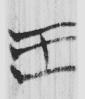王
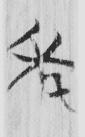年
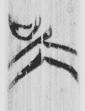吳
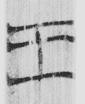王
